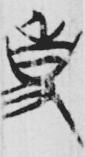事
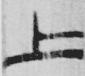上
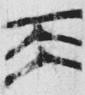天
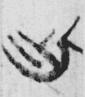此
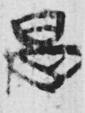是
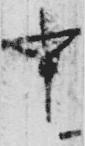才（哉）
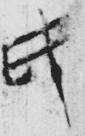女（若）
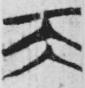天（夫）
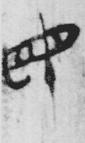母（毋）
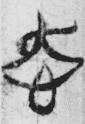○（愛）
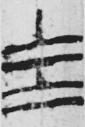圭（珪）
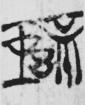璧
